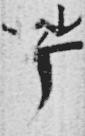苽（瓜）
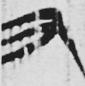又（有）
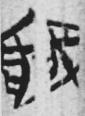○（藏）
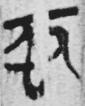○（願）
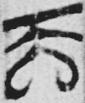而
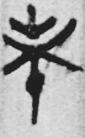未
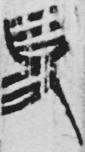○（得）
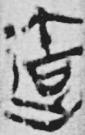○（達）
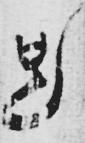也
